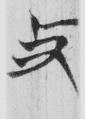攴
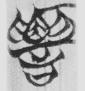{𦥑角言}
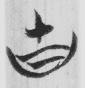由
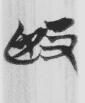臤
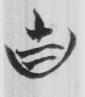由
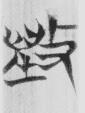毀
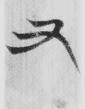又
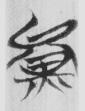{允田火}
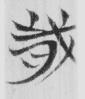歲
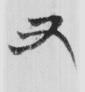又
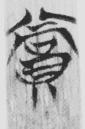賞
